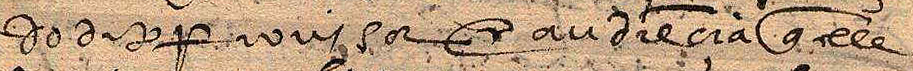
do dito prouisor ē audiēçia q̄ elle
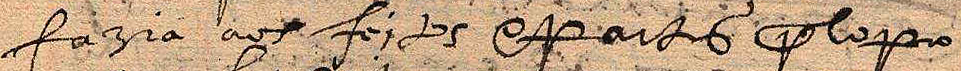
fazia aos fejtos e partes p̄lo pro
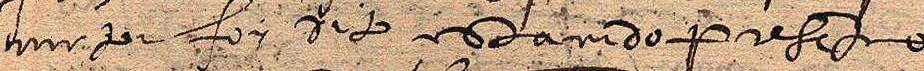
metor foy dito estamdo presēte o
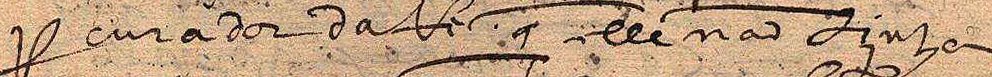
ꝑcurador da Re q̄ elle não tinha
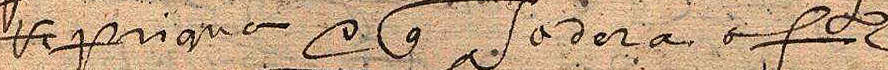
Repriqua e q̄ Ja dera o fto
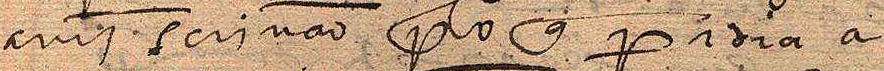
a mj̄ scriuão p̄lo q̄ pidia a
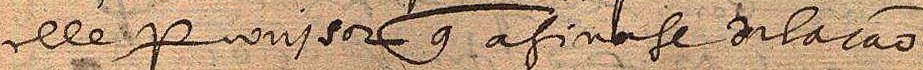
elle proujsor q̄ asinase dilacão
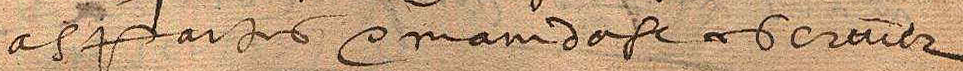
as partes e mamdase escreuer
